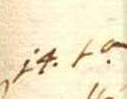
i4. t.a
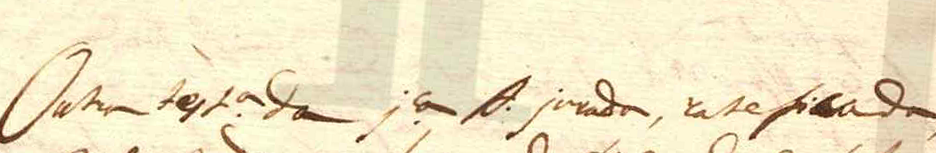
Outra testa da j.ça A. jurada, rateficada
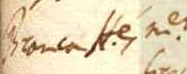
Branca H.es mer
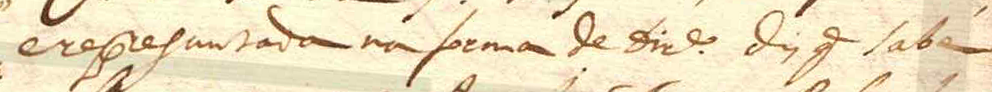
e repreguntada na forma de dir.to dis q̄ sabe
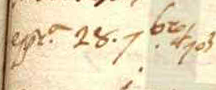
e pr.a 28 7.bro d̄ 703
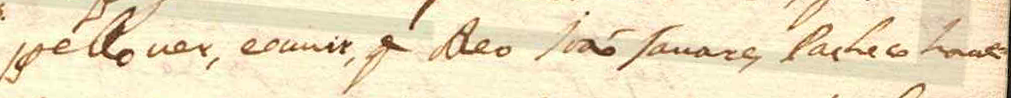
pello uer, e ouuir, q̄ Reo Ioaõ Tauares Pacheco haue
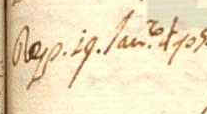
Rep i9. Ian.ro d̄ 705.
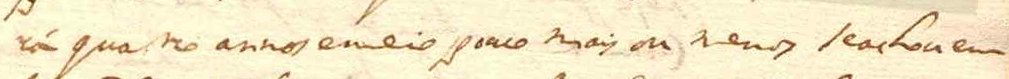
rá quatro annos e meio pouco mais ou menos se achou em
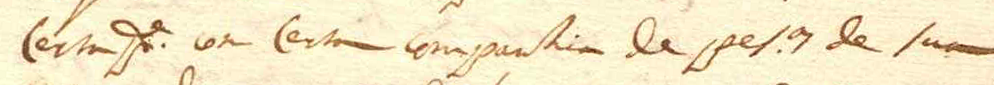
Certa p.te com Certa companhia de pes.as de sua
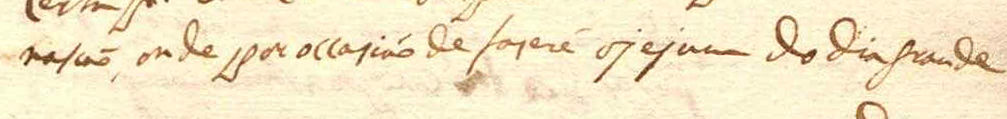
nassaõ, onde por occasiaõ de fazerē o jejum do dia grande
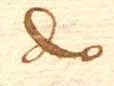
do
